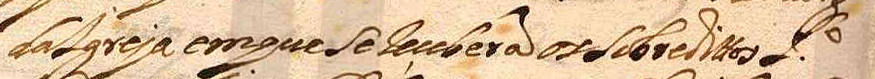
da Igreja, em que se Reçeberaõ os sobredittos P.o
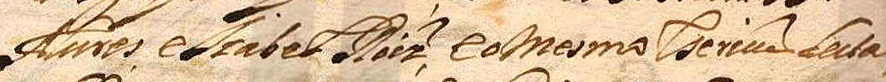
Alures, e Izabel Roiz̄, e o mesmo Escriuaõ desta
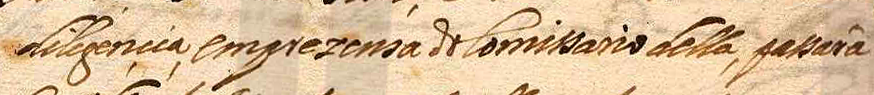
diligençia, em prezensa do Comissario della, passará
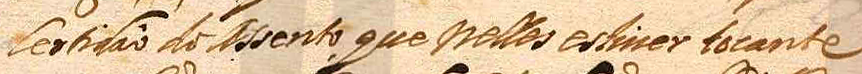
Certidaõ do assento que nelles estiuer tocante
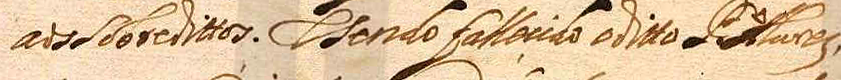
aos sobredittos. E sendo fallecido o ditto P.o Alures,
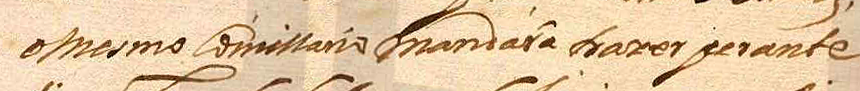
o mesmo Comissario mandará trazer perante
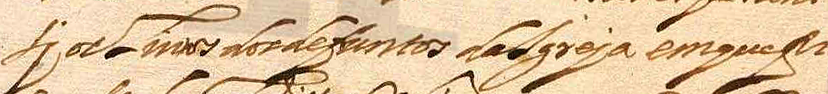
sj os Liuros dos defuntos da Igreja, em que foi
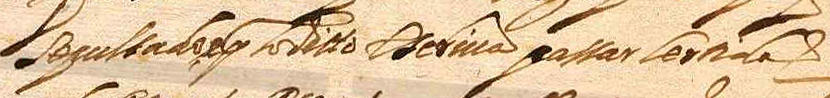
sepultado, e p̄lo ditto escriuaõ passar Certidaõ
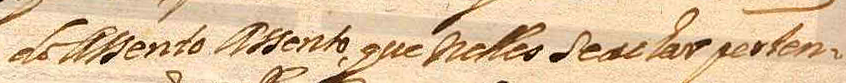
do assento assento, que nelles se achar perten
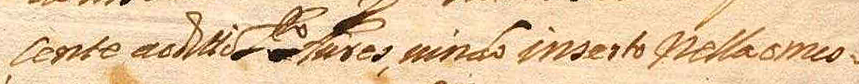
cente ao ditto P.o Alures, uindo inserto nella o mes
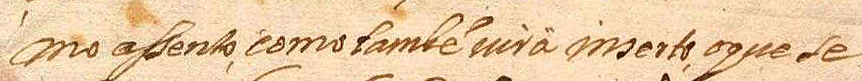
mo assento como tambē uira inserto, o que se
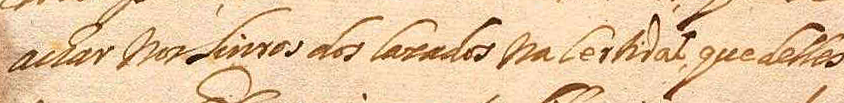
achar nos Liuros dos cazados na Certidão, que delles
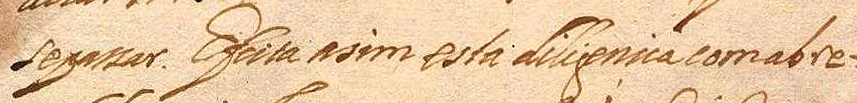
se passar. E feita asim esta diligenica com a bre
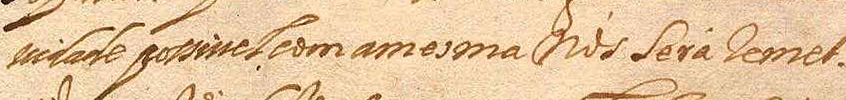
uidade possiuel com a mesma nos será Remet
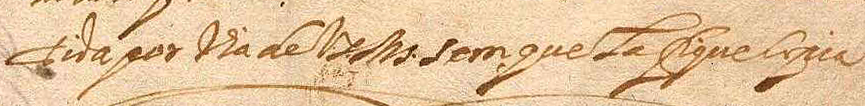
tida por via de Vs Ms sem que La fique Copia
